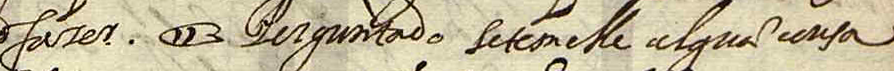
o fazer. ⁋ Perguntado se tem elle alguā cousa
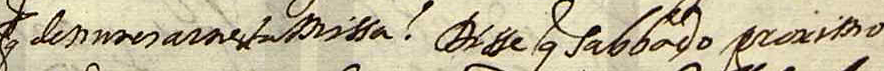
q̄ denunciar nesta missa? Disse q̄ sabbado proximo
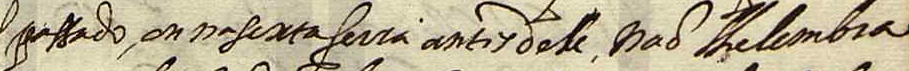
passado, ou na sexta feira antes dele, naõ lhe lembra
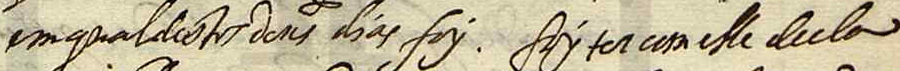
em qual destes dous dias foy . foy ter com elle decla
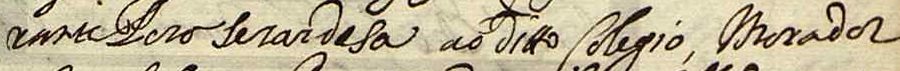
rante Pero Sezar de Sa ao ditto Colegio, Morador
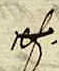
ref.
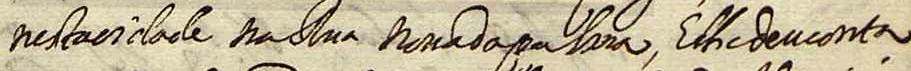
nesta cidade na Rua noua da palma, E lhe deu conta
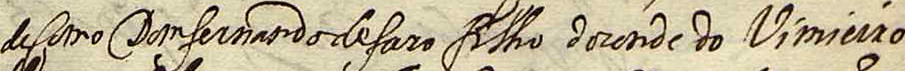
de Como Dom fernando de faro filho do conde do Vimieiro
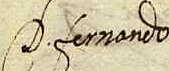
D. fernando
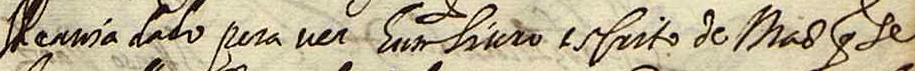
lhe auia dado pera uer hum liuro esCrito de Maõ q̄ se
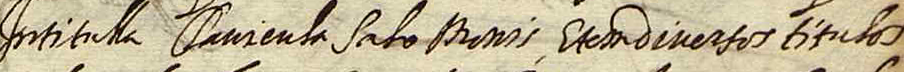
Jntitulla Clauicula SaLoMonis, E tem diuersos titulos
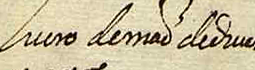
Liuro de maõ de diuer
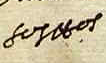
sos tt.os
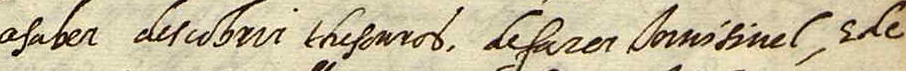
a saber descobrir thesouros, de fazer Inuisiuel, E de
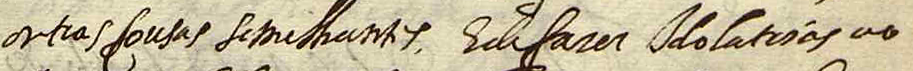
outras Cousas semelhantes, E de fazer Idolatrias ao
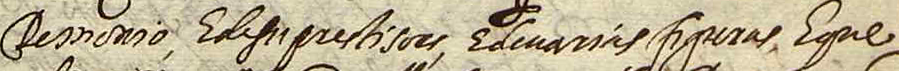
Demonio, E de suprestisoes, E de uarias figuras, E que
